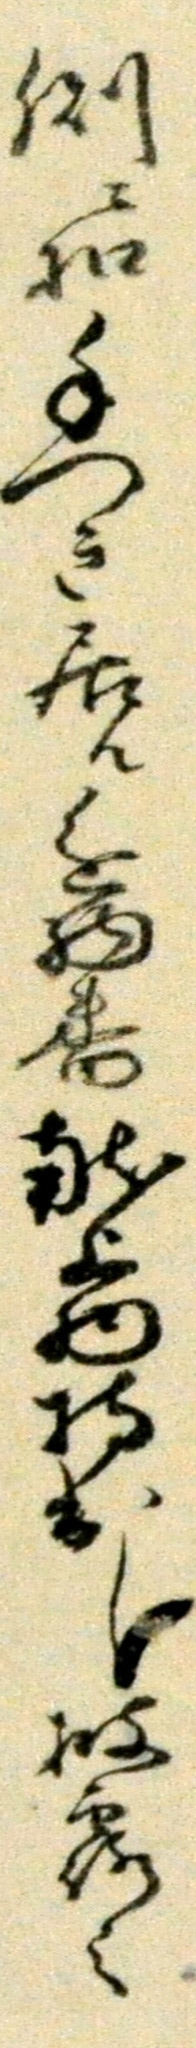側ニ扣手つき居ㇽ進物番献上物持出し披露之
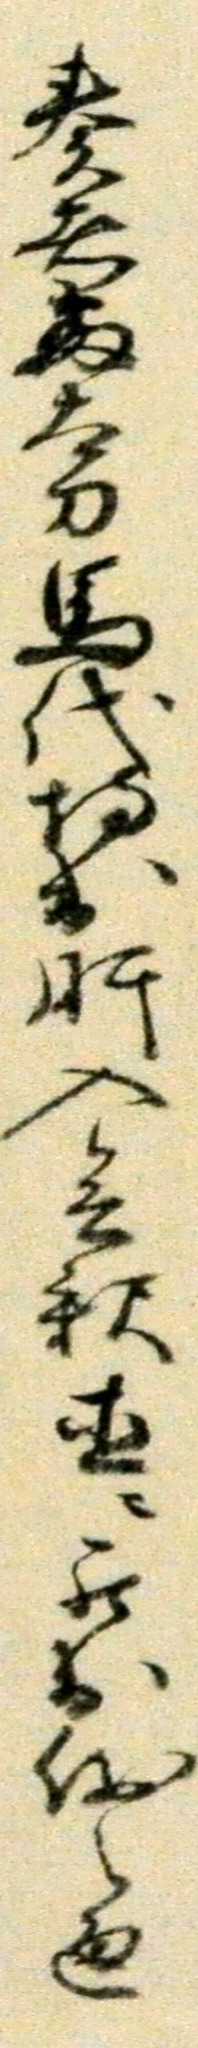奏者番太刀馬代持出肝入会釈直ニ罷出咄之通
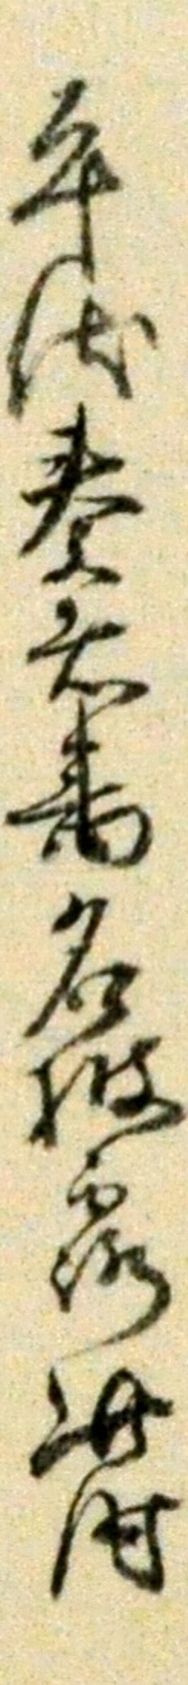平伏奏者番名披露此時
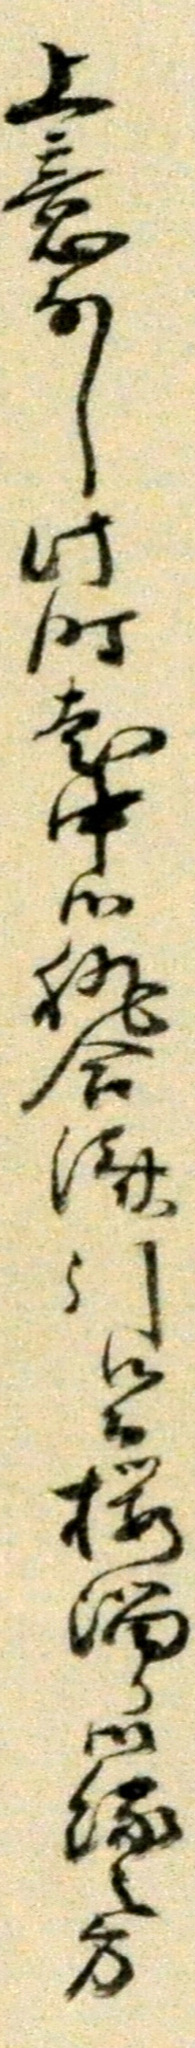上意なし此時老中御執合済引候而楼溜り御縁之方
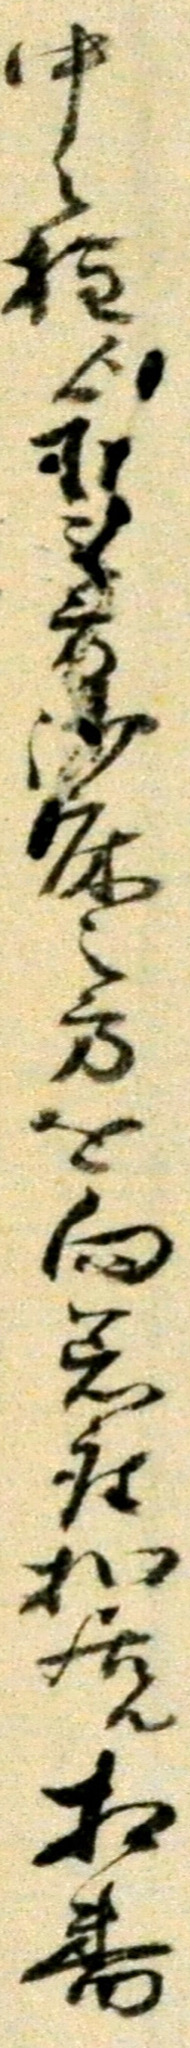中之柱ゟ座敷方御床之方を向着座扣居ㇽ相番
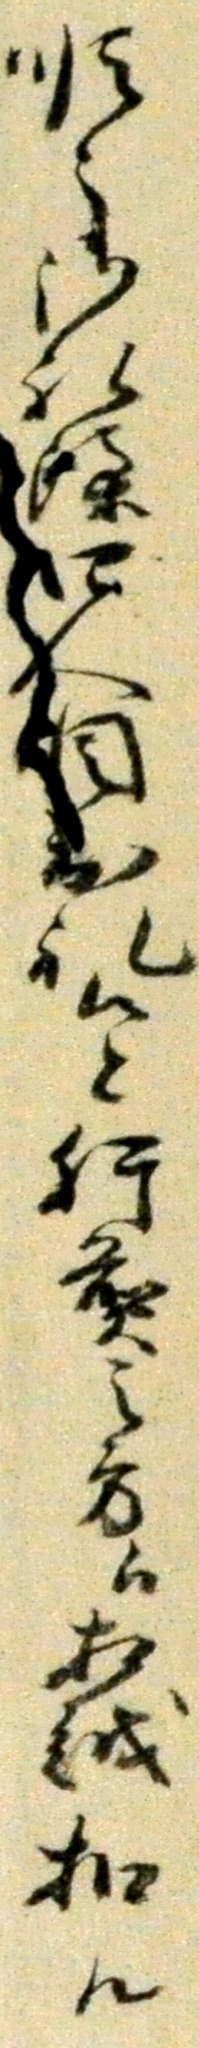順々御礼済四人礼候と肝煎之方江相越扣ㇽ
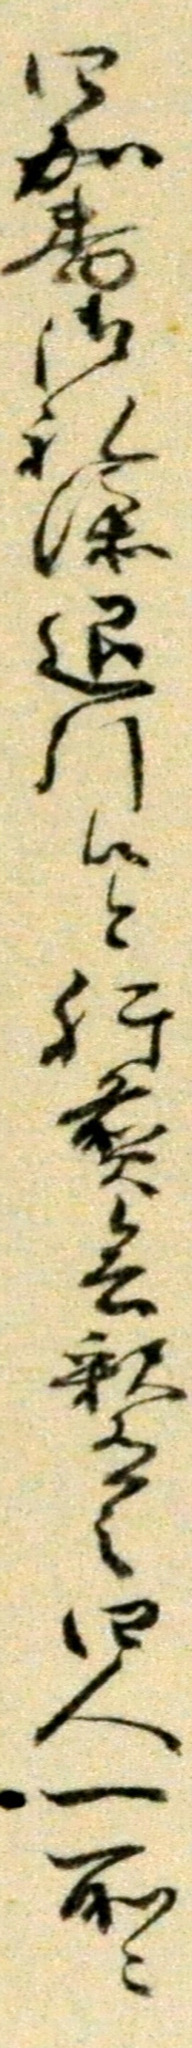四加番御礼済退引候肝煎会釈有之四人一所二
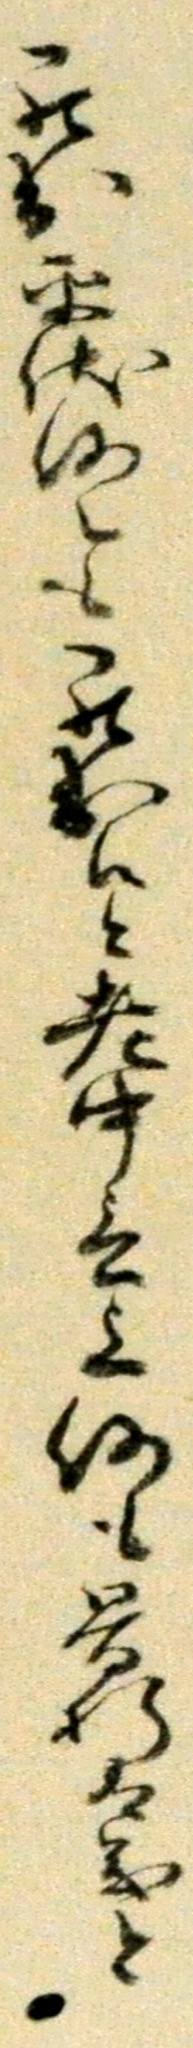罷出平伏何ㇾも罷出候と老中言上何も暑折太義と
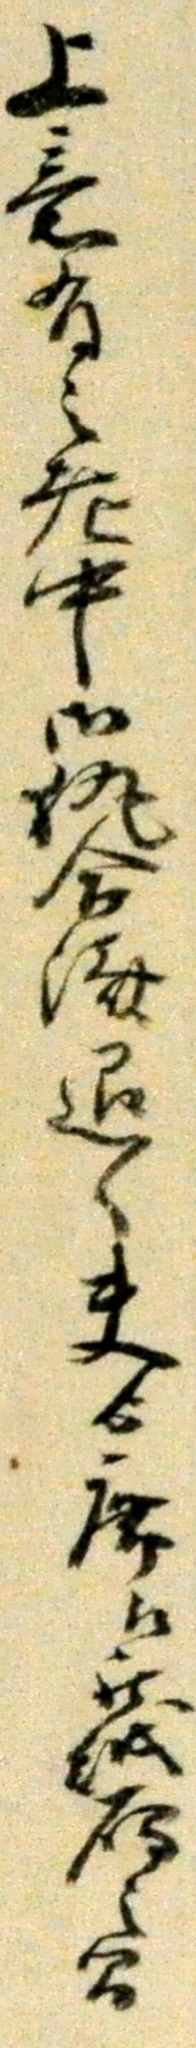上意有之老中御執合済退く夫ゟ席江罷越雁之間
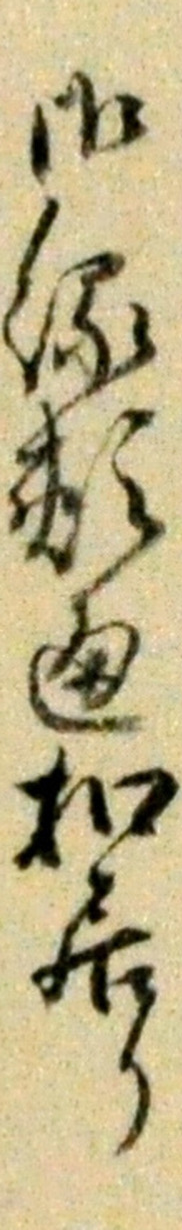御縁頬通扣居り
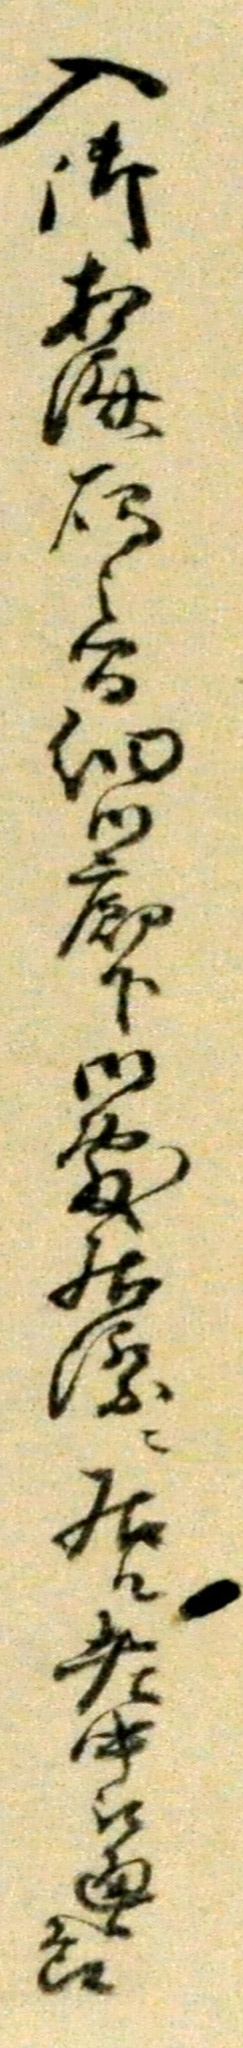入御相済雁之間仰御廊下御敷居際ニ居ㇽ老中被通候節
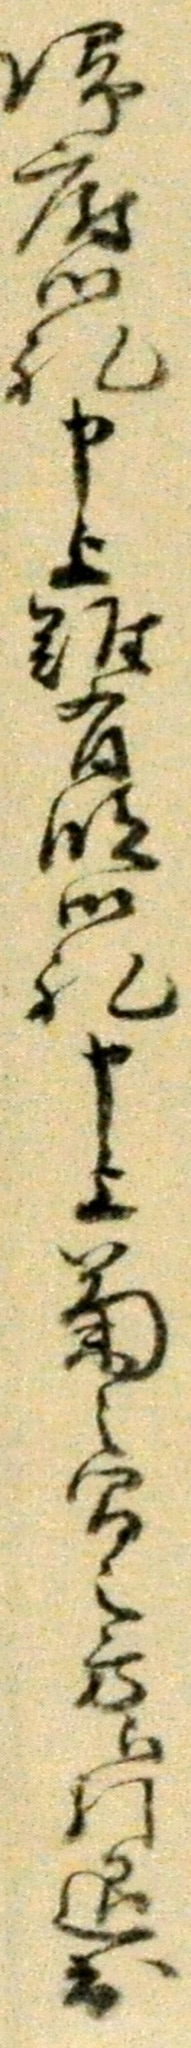帰府御礼申上難有段御礼申上菊之間之方江引退出
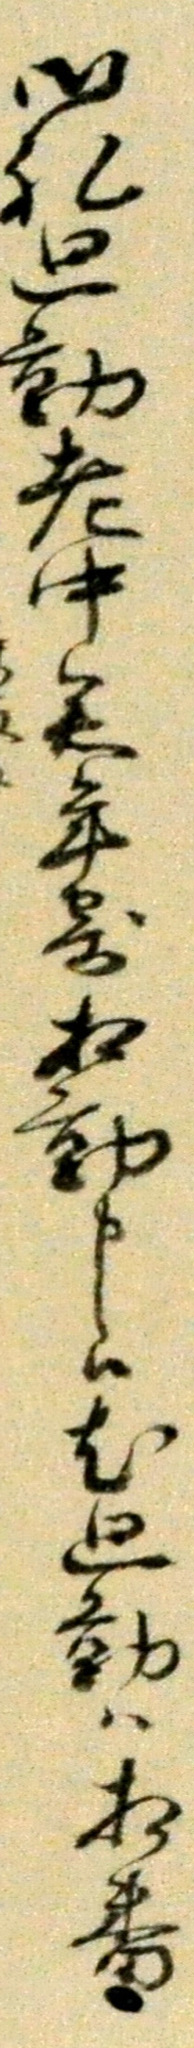御礼廻勤老中若年相勤申候尤廻勤ㇵ相番
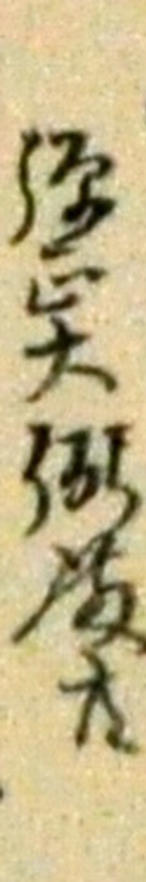弾正忠矦殿共
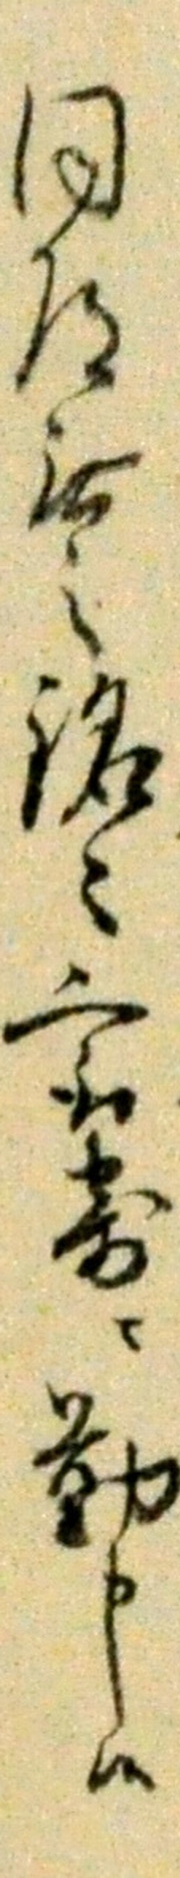同道無之銘々最寄ニ勤申候
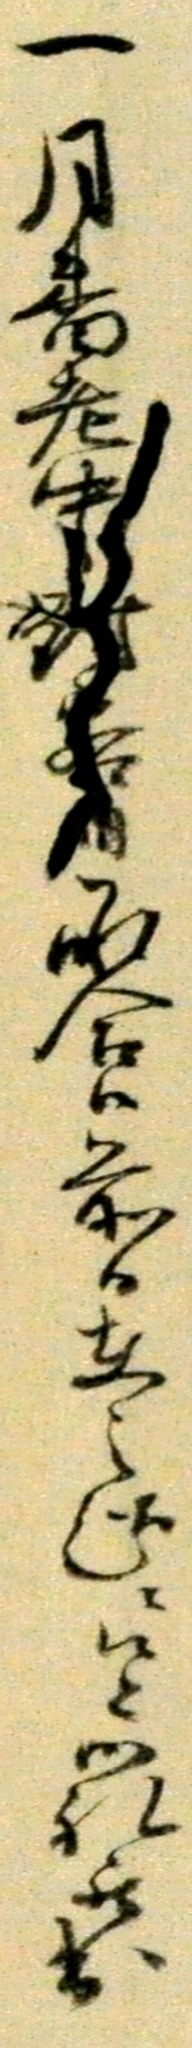一月番老中承合候前々在之趣ニ候と御礼被出
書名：大阪加番関係諸書留〔一括〕
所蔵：伊那市立高遠町図書館・合同会社AMANE
